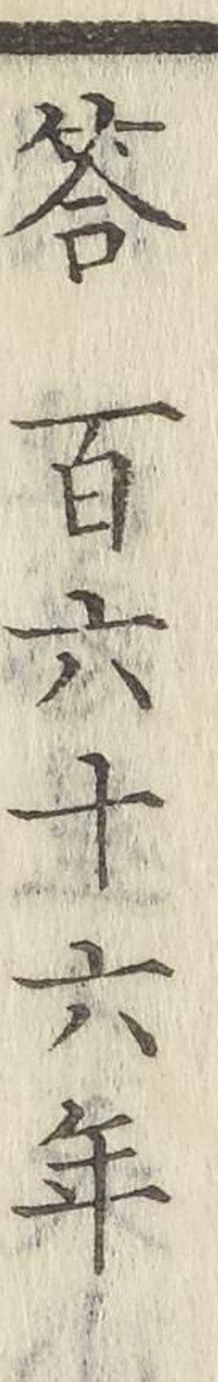答百六十六年
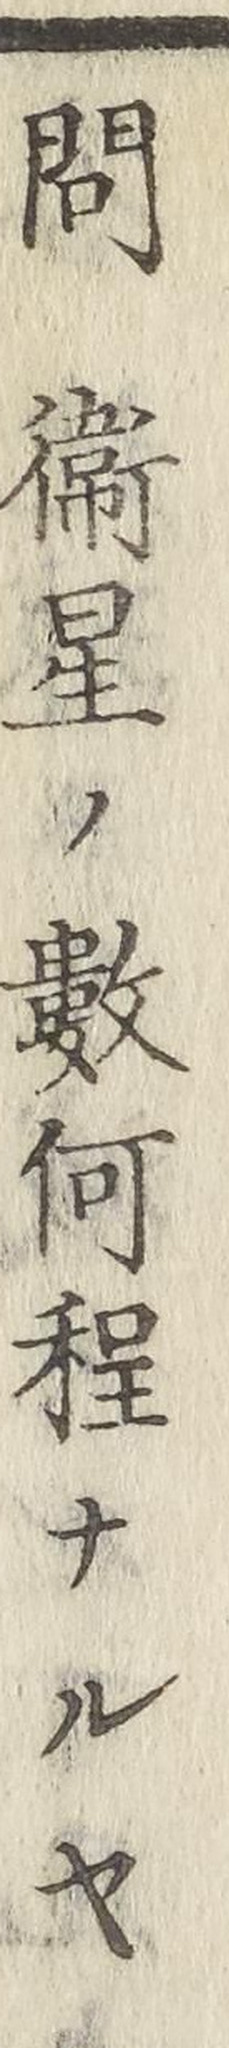問衞星ノ数何程ナルヤ
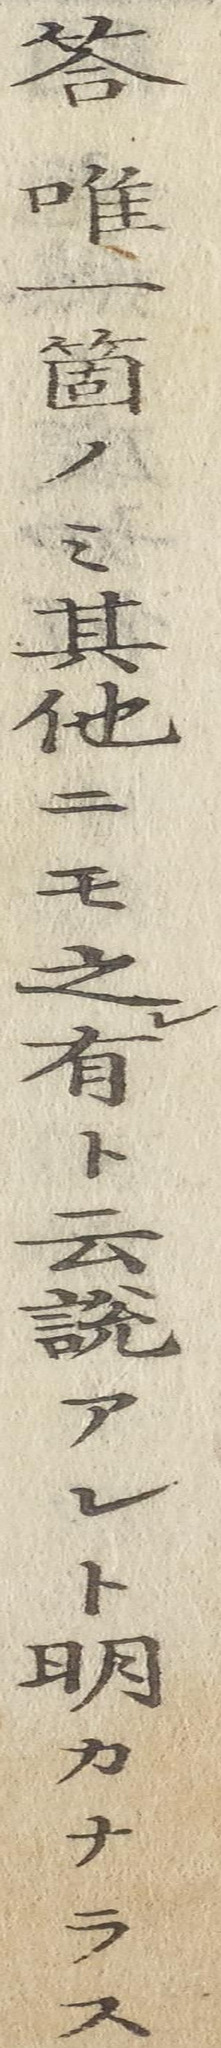答唯一箇ノミ其他ニモ之有ト云説アレト明カナラス

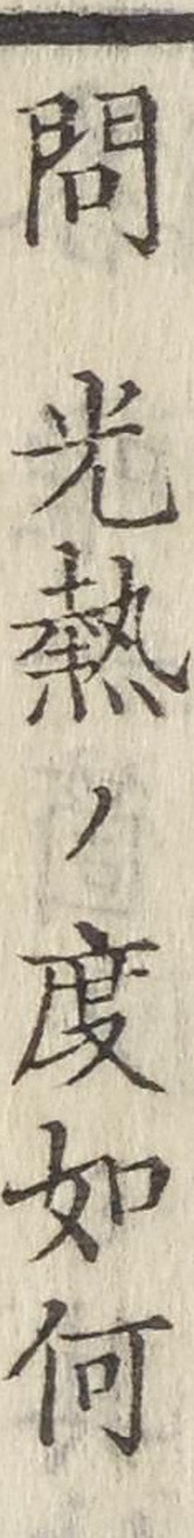問光熱ノ度如何
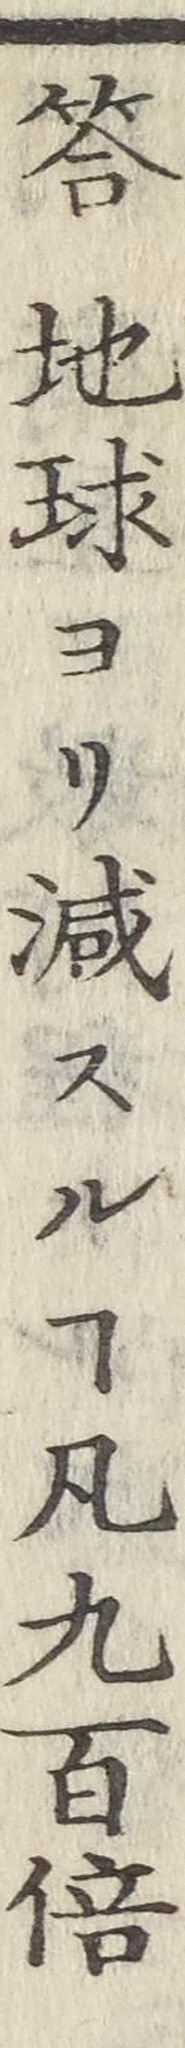答地球ヨリ減スルコト凡九百倍
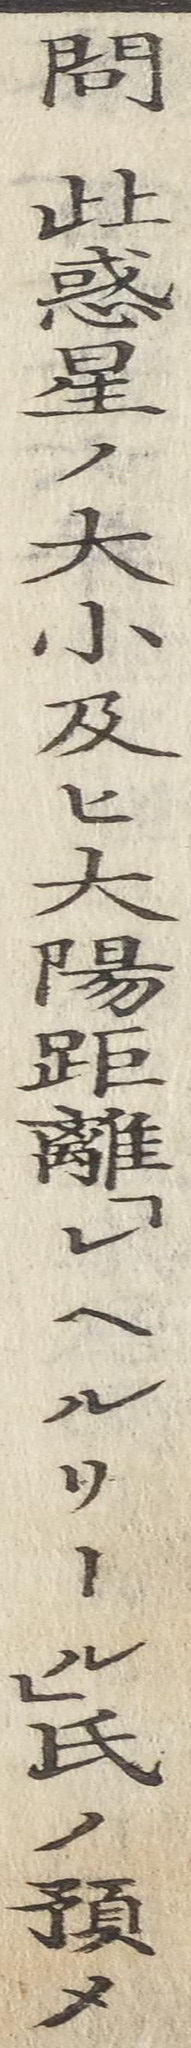問此惑星ノ大小及ヒ大陽距離「レヘルリール」氏ノ預メ
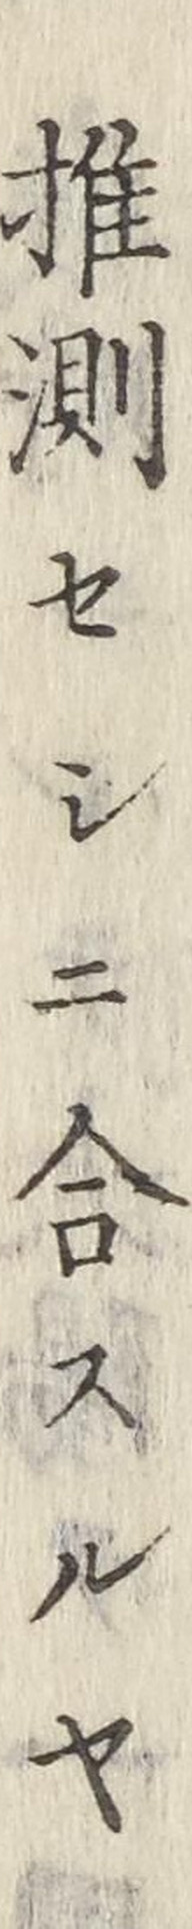推測セシニ合スルヤ
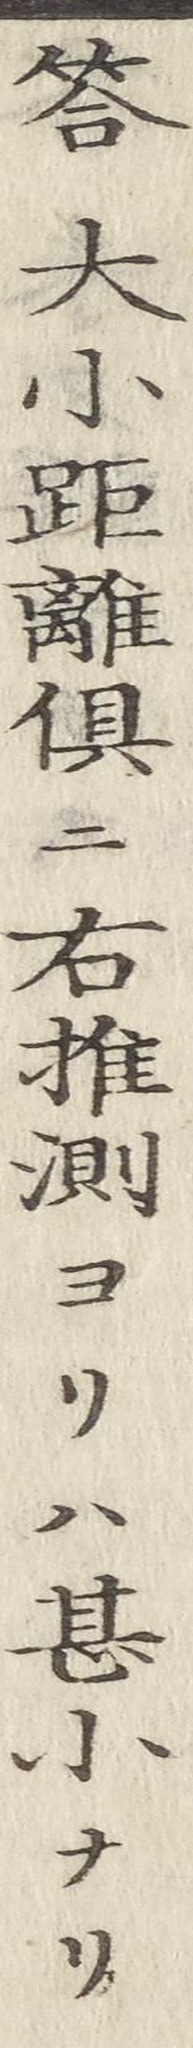答大小距離倶ニ右推測ヨリハ甚小ナリ
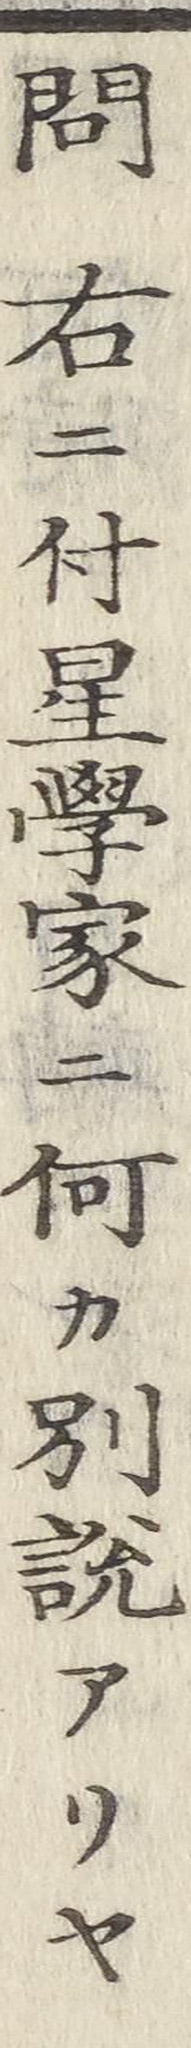問右ニ付星学家ニ何カ別説アリヤ
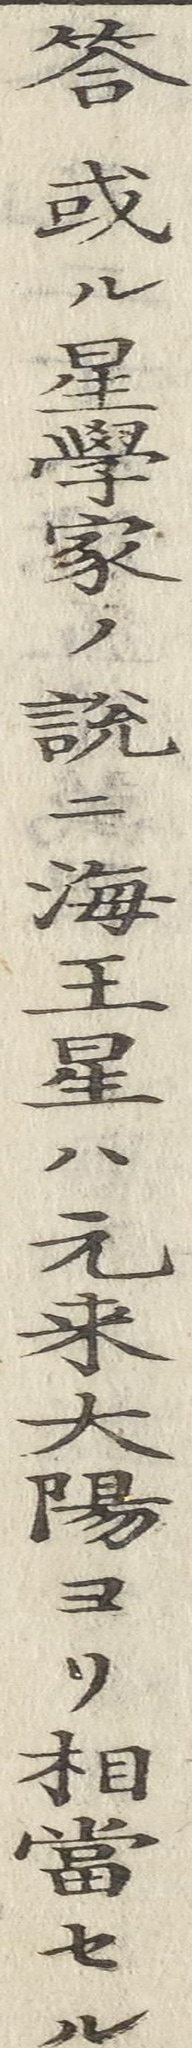答或ル星学家ノ説ニ海王星ハ元来大陽ヨリ相当セル
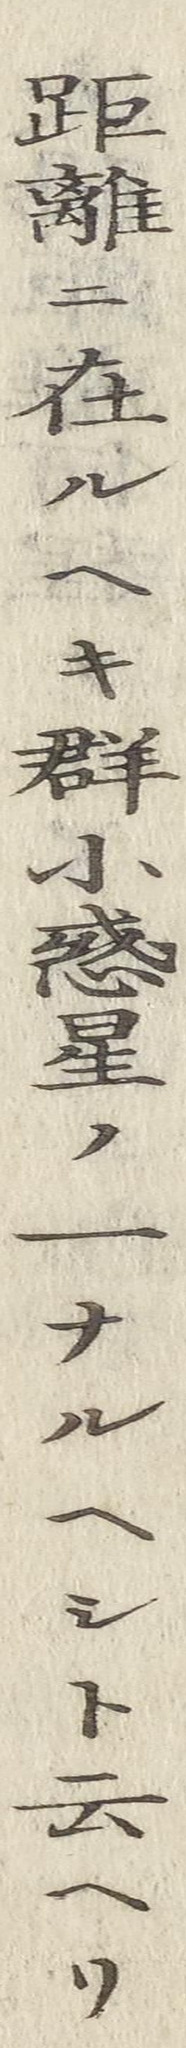距離ニ在ルヘキ群小惑星ノ一ナルヘシト云ヘリ
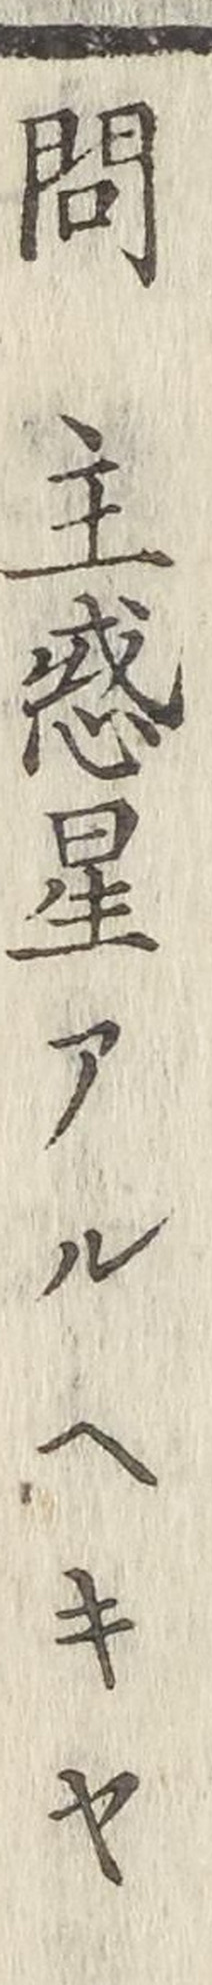問主惑星アルヘキヤ
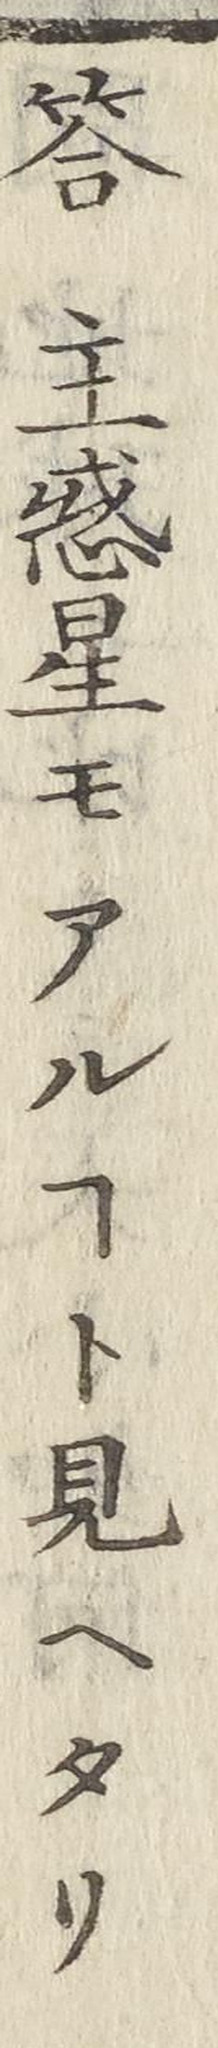答主惑星モアルコトト見ヘタリ
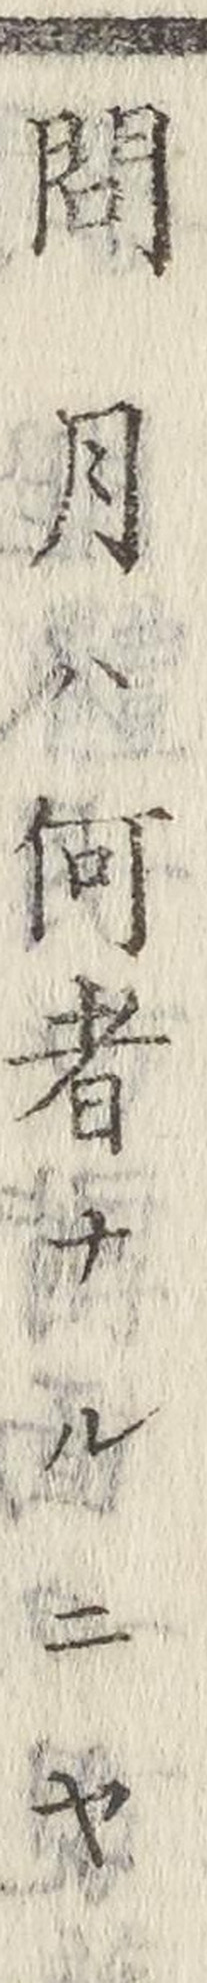問月ハ何者ナルニヤ
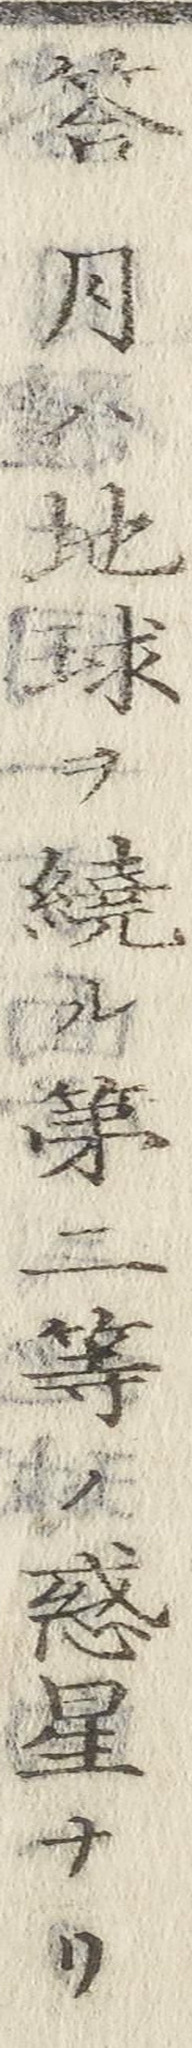答月ハ地球ヲ繞ル第二等ノ惑星ナリ
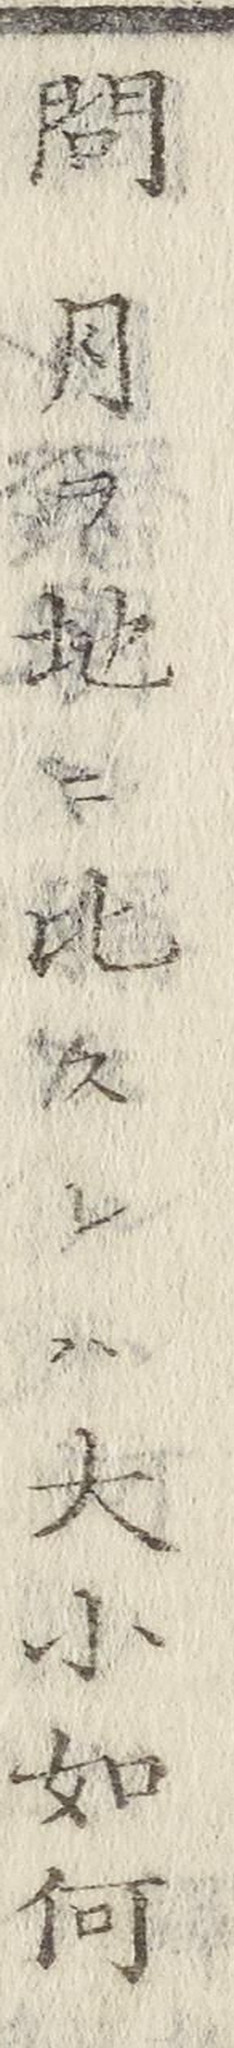問月ヲ地ニ比スレハ大小如何
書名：星学圖説　下
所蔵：東京大学地震研究所図書室 Earthquake Research Institute Library, The University of Tokyo, JAPAN
